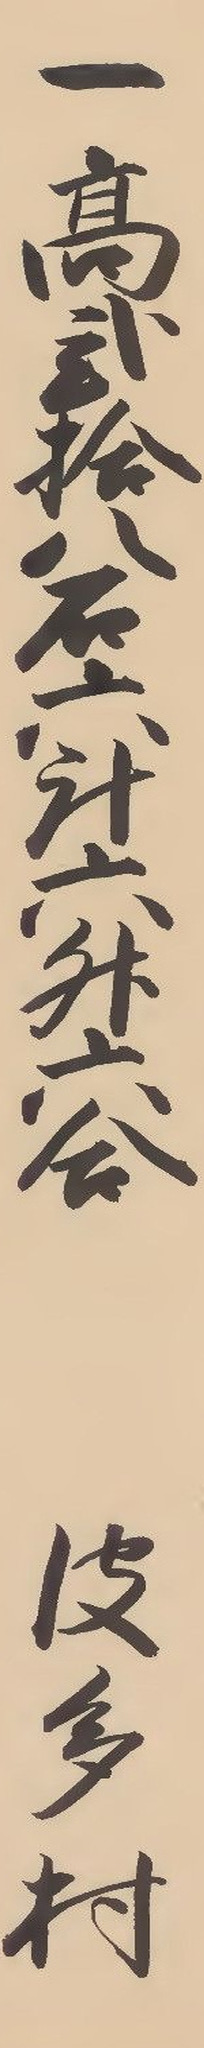一高弐拾八石六斗六升六合皮多村
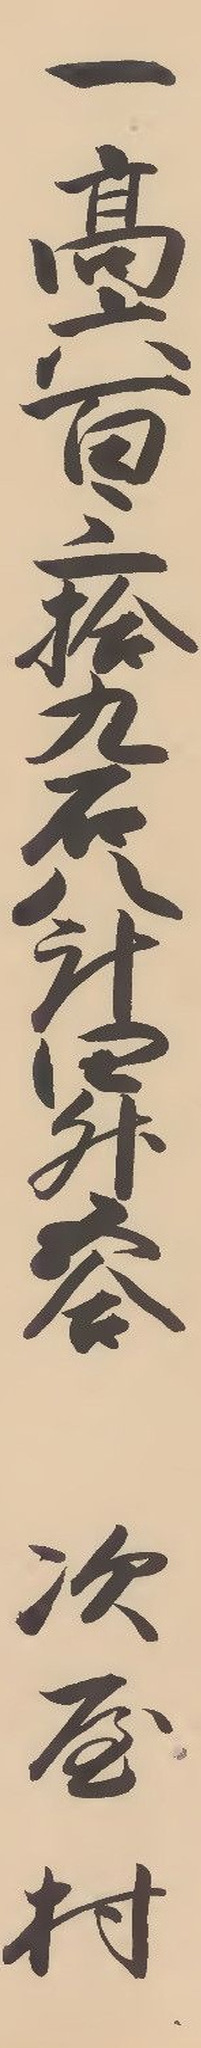一高六百三拾九石八斗四升五合次屋村
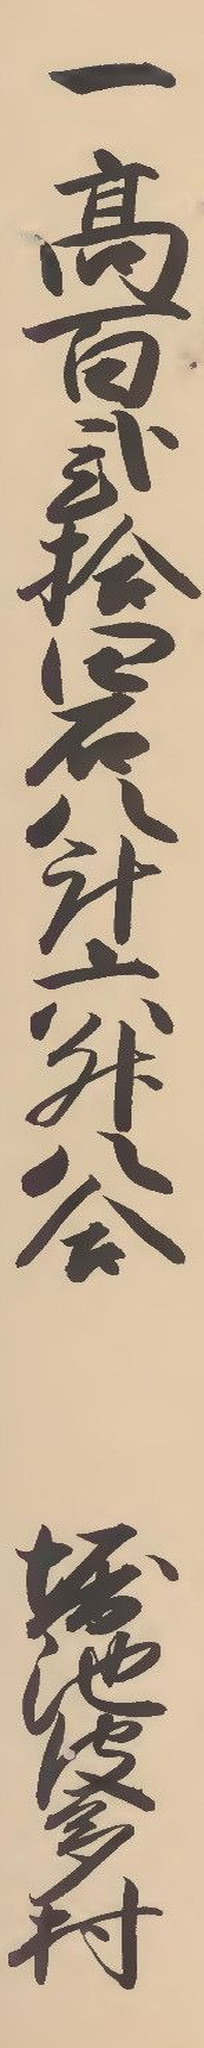一高百弐拾四石八斗六升八合堀池皮多村
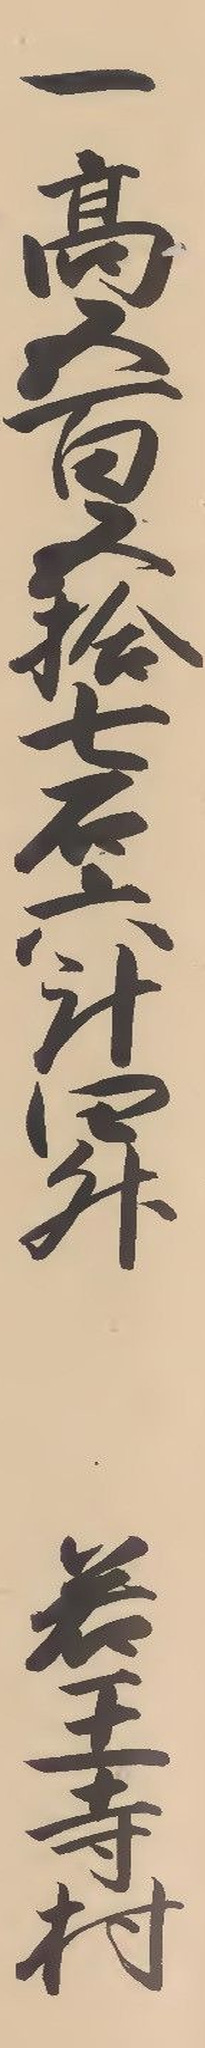一高五百五拾七石六斗四升若王寺村
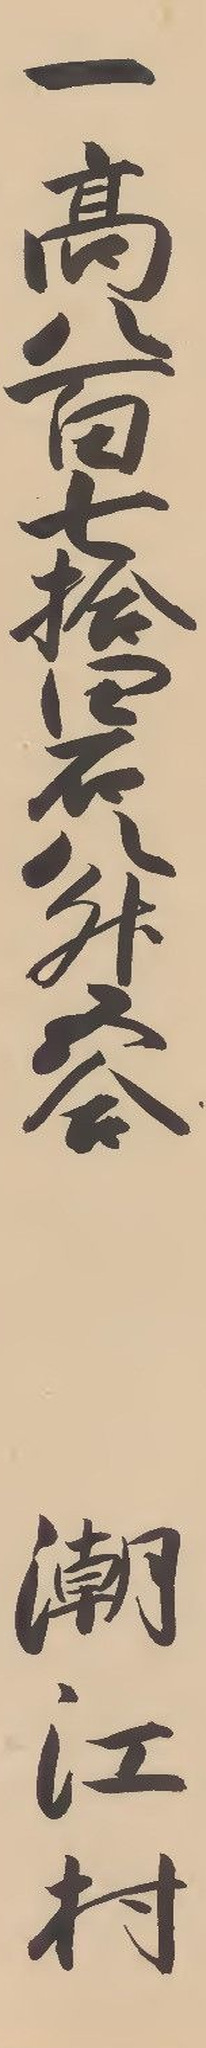一高八百七拾四石八升五合潮江村
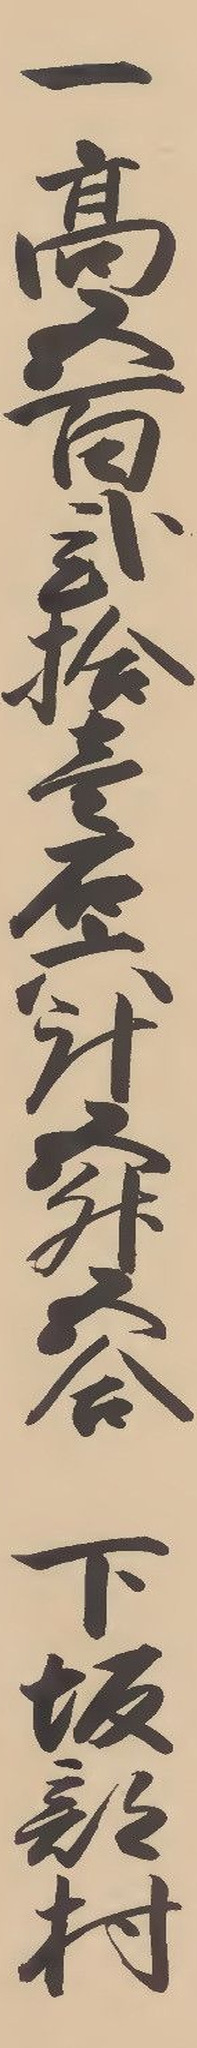一高五百弐拾壱石六斗五升五合下坂部村
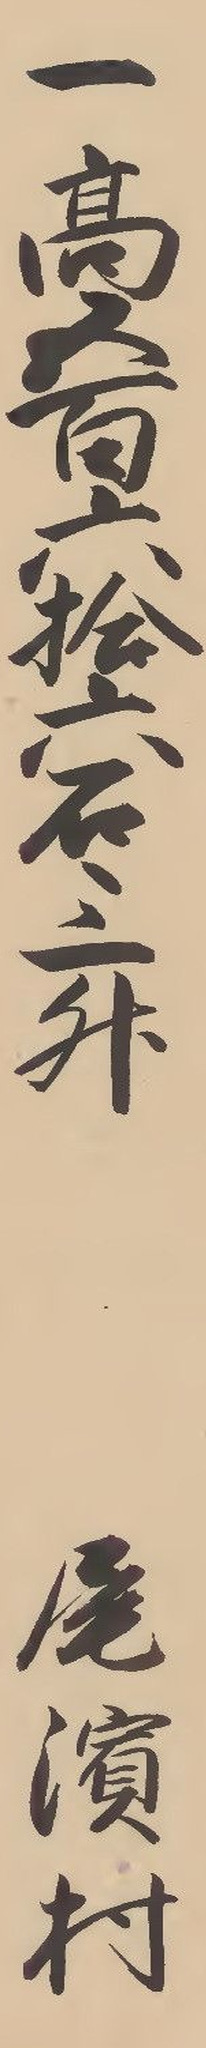一高五百六拾六石三升尾浜村

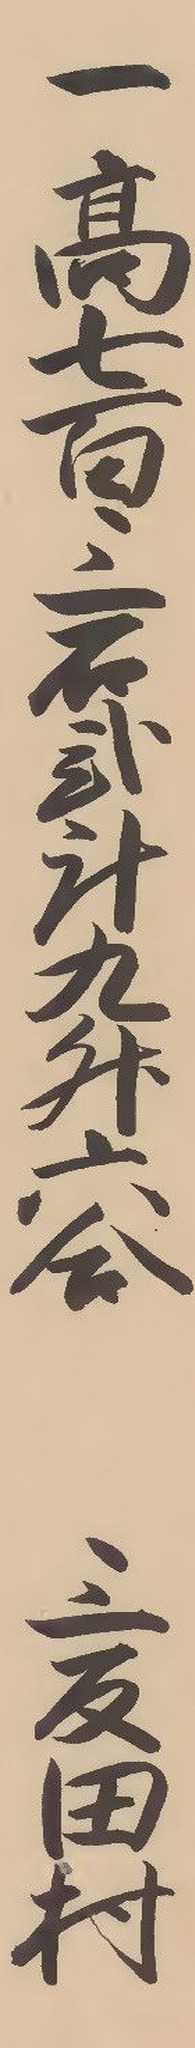一高七百三石二斗九升六合三反田村
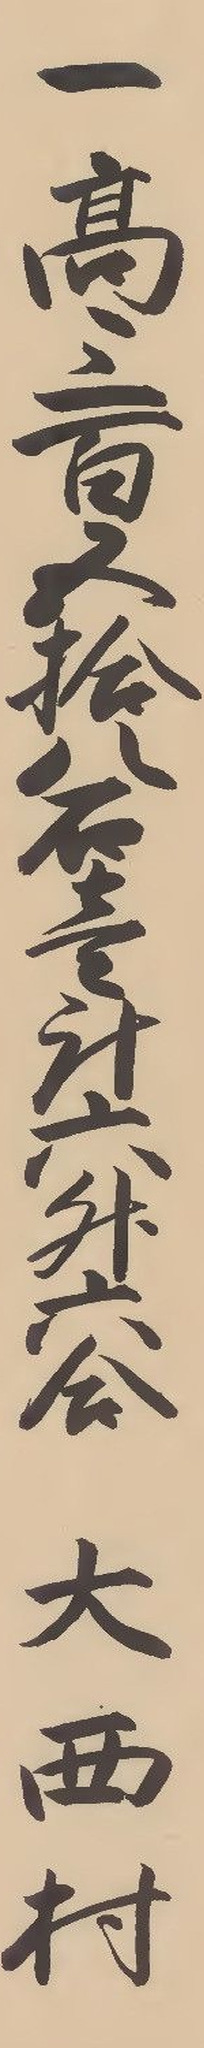一高三百五拾八石壱斗六升六合大西村
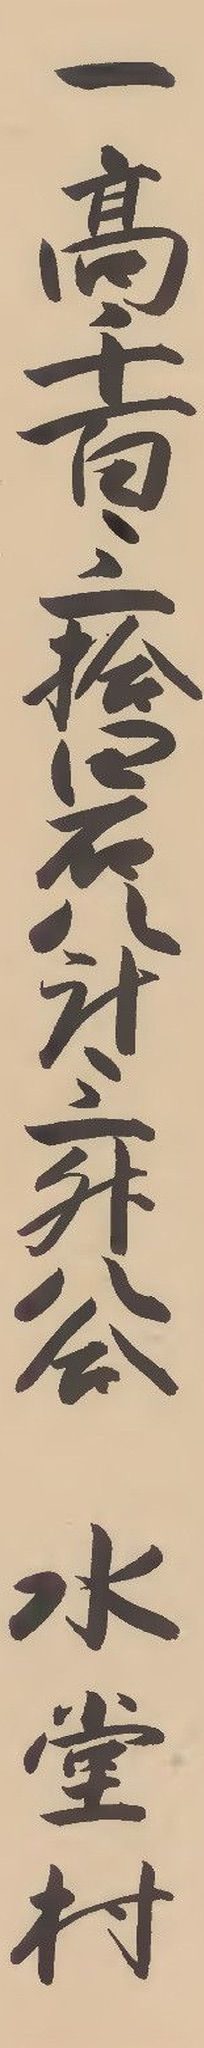一高千百三拾四石八斗三升八合水堂村
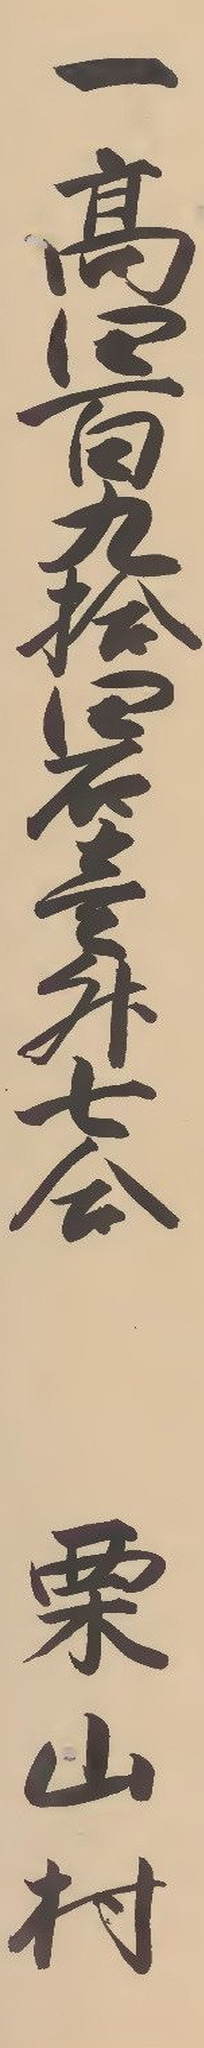一高四百九拾四石壱升七合栗山村
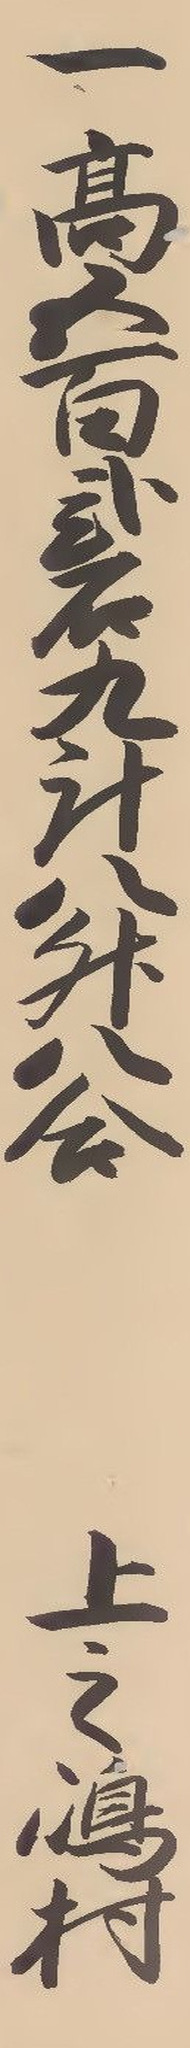一高五百弐石九斗八升八合上之島村
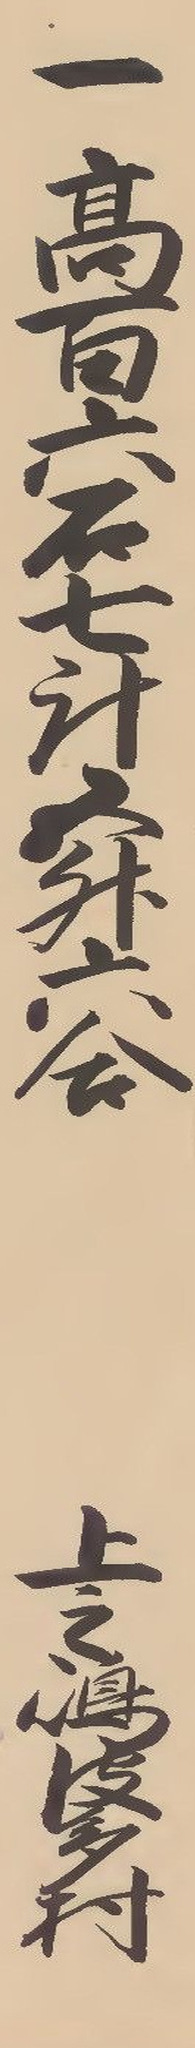一高百六石七斗五升六合上之島皮多村
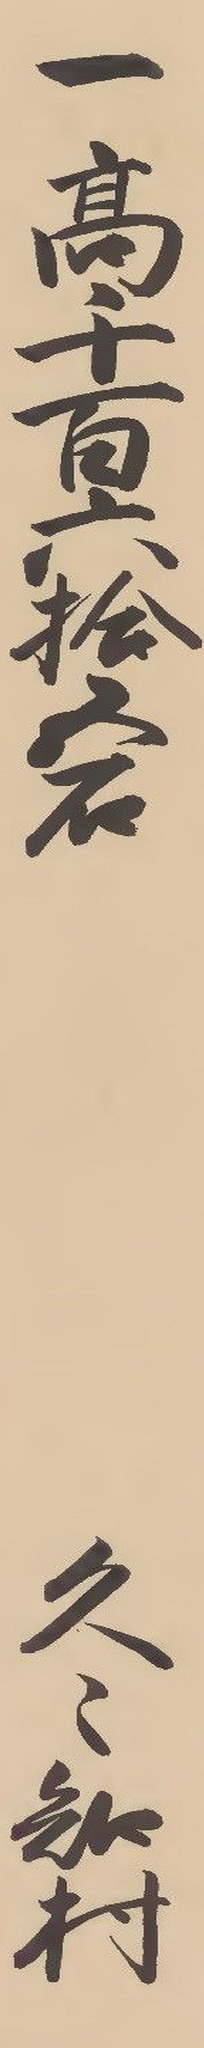一高千百六拾五石久々知村
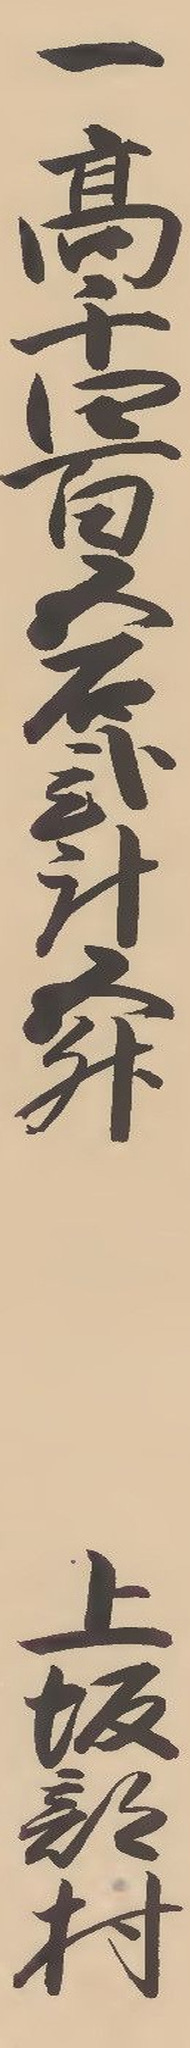一高千四百五石弐斗五升上坂部村

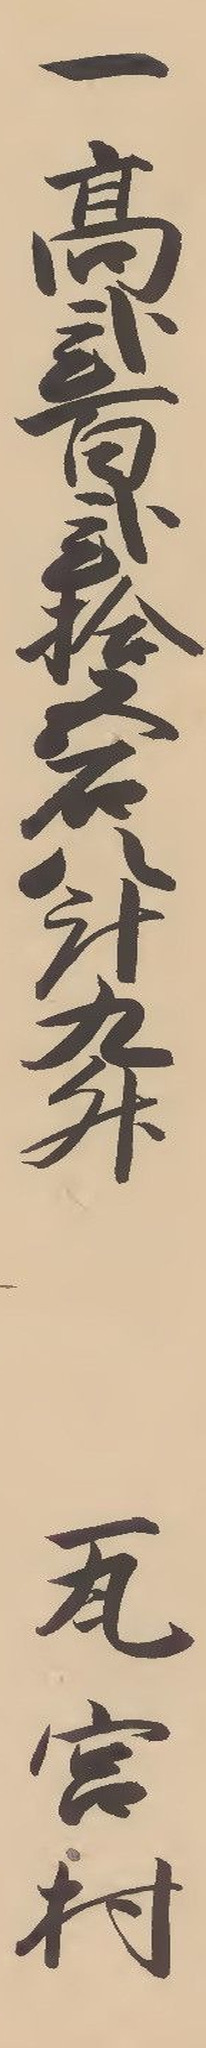一高弐百弐拾五石八斗九升瓦宮村
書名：摂津国郷帳
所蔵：国立公文書館 National Archives of Japan
